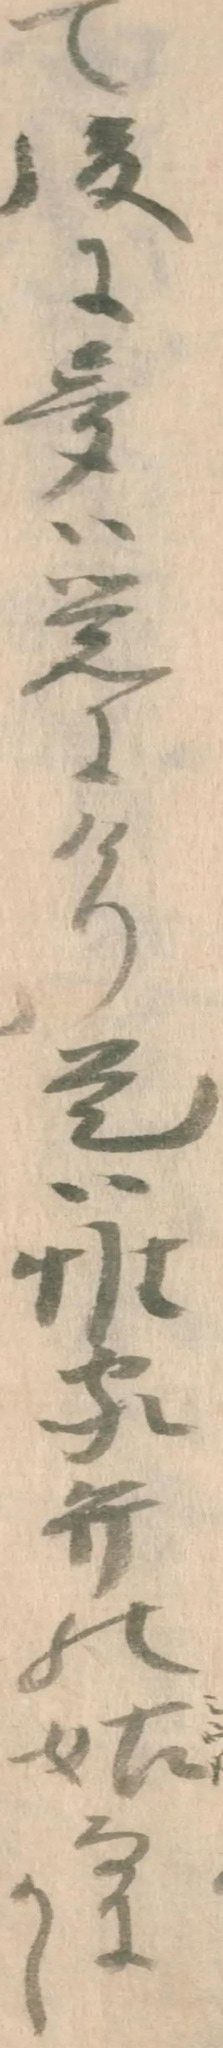て後に夢は覚にけり是は惟家弁の姑なにかし
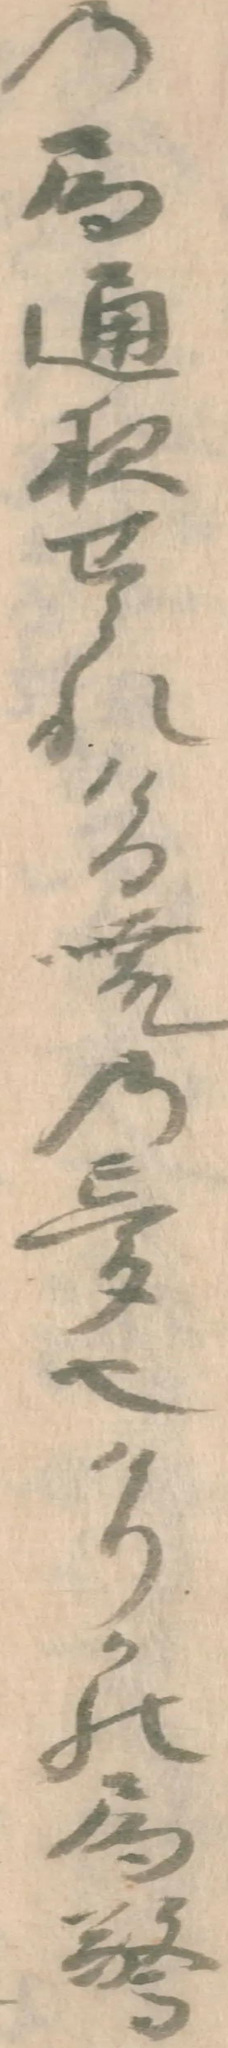の局通夜せられける暁の夢也けりかの局驚
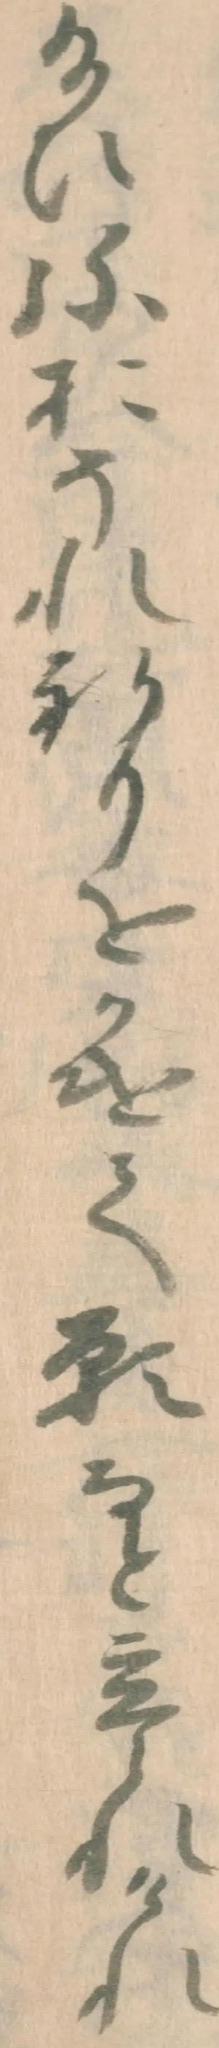給ひ弥おそれ祈りをかけて願なと立られけれ
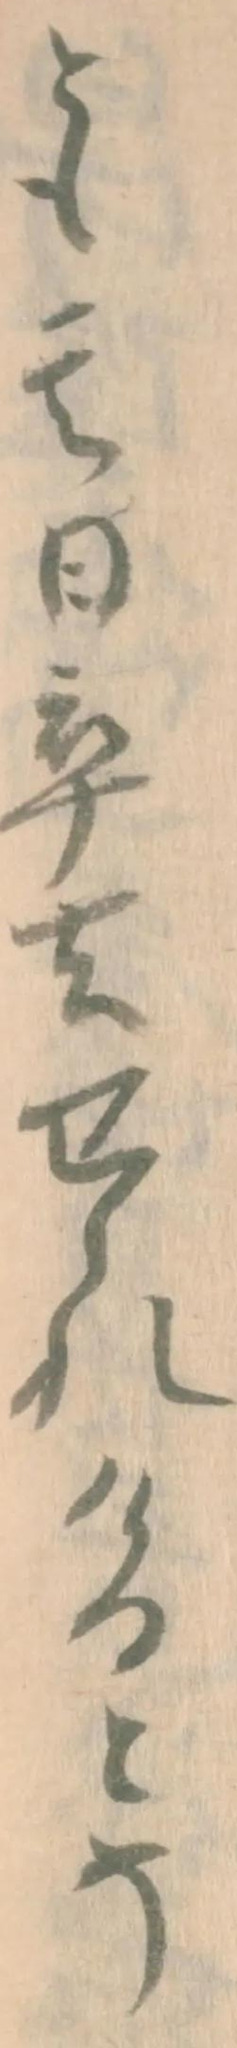とも其日卒去せられけるとそ
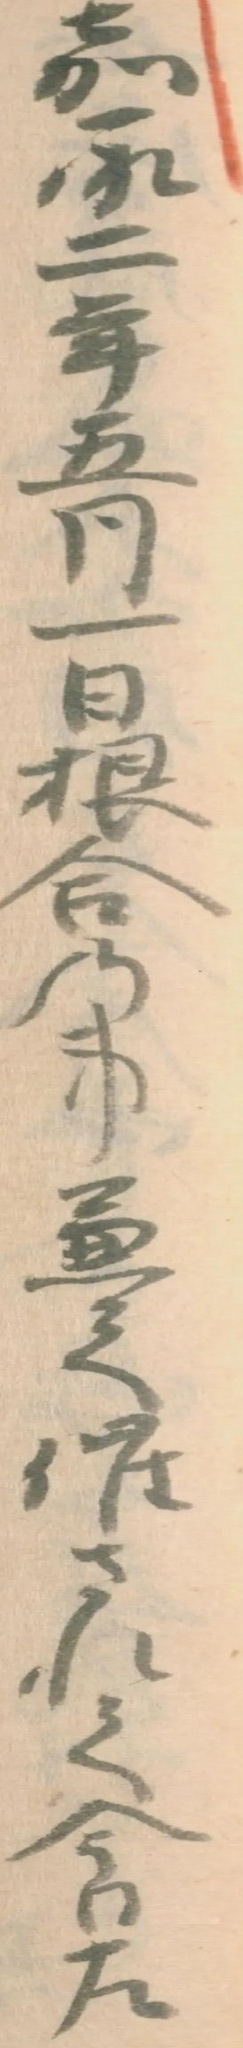嘉承二年五月一日根合の事兼て催されて今日左
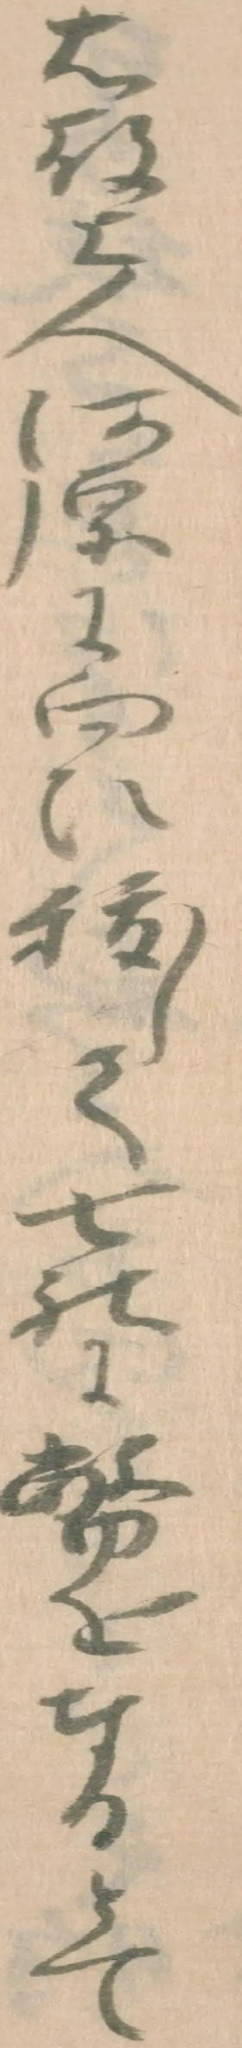右殿上人河原に向ひ祓して七社に幣を奉るとて
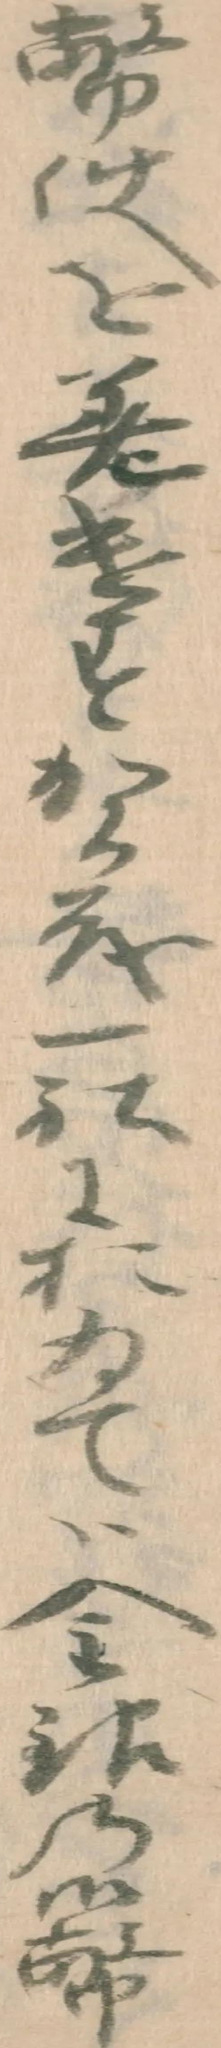幣使を差遣す賀茂一社におゐては金銀の御幣
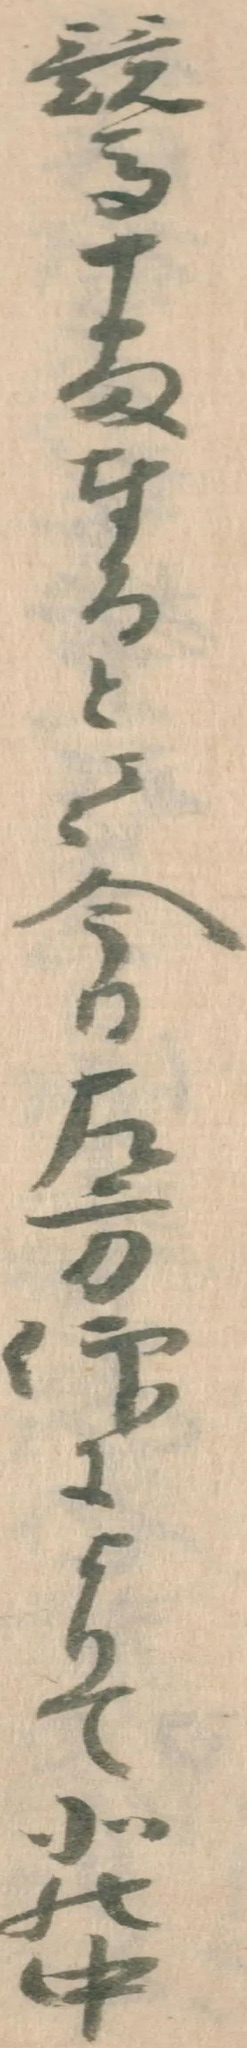競馬十番奉ると云々今日左方仰によりて北の中
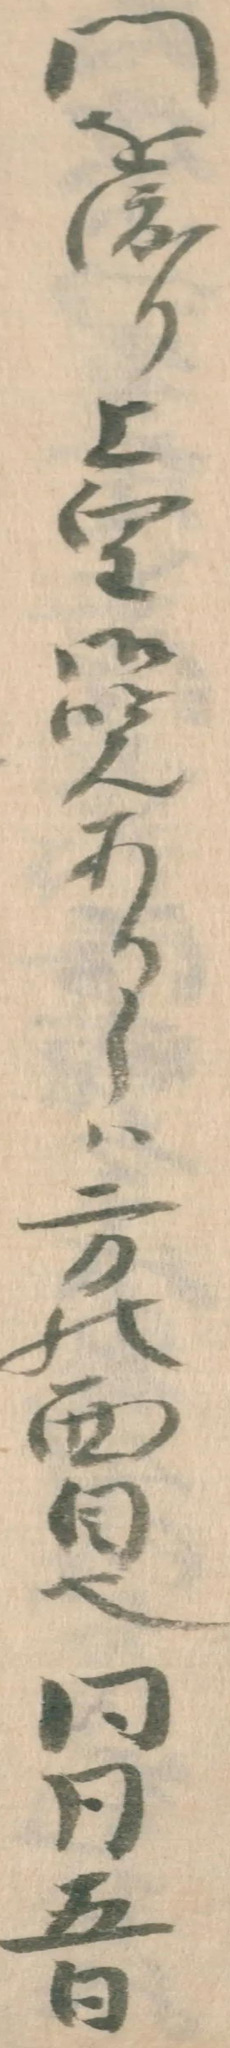門を渡り上皇御覧ありしは方の面目也同月五日
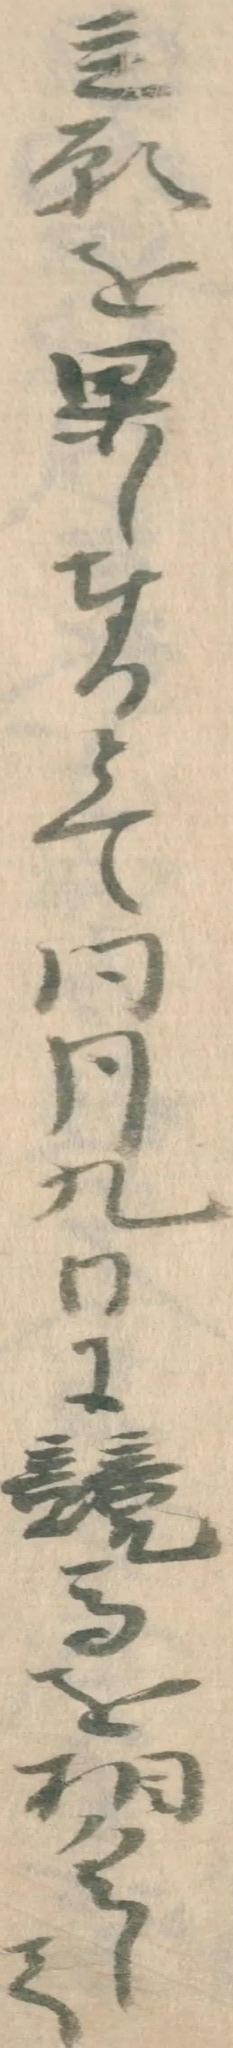立願を果し奉るとて同月九日に競馬を相具して
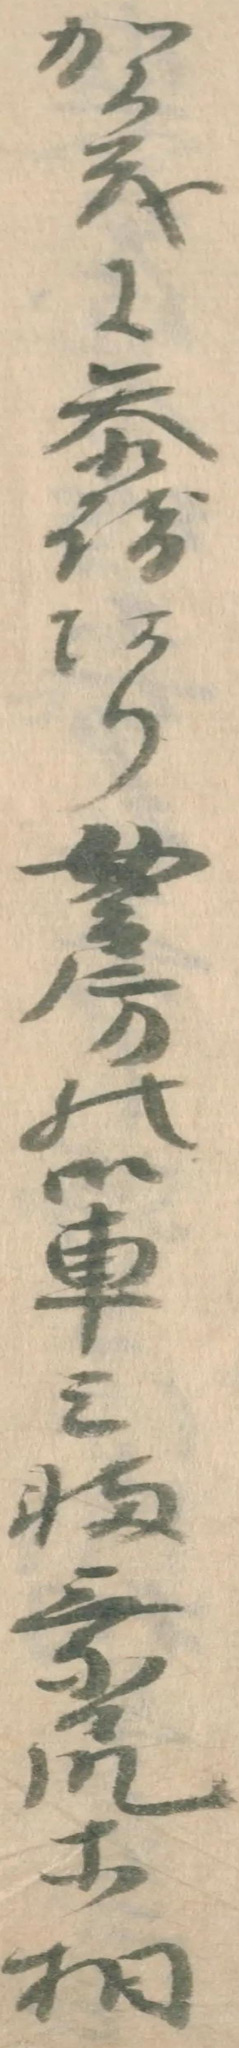賀茂に参詣あり女房の御車三輌乗尻等相
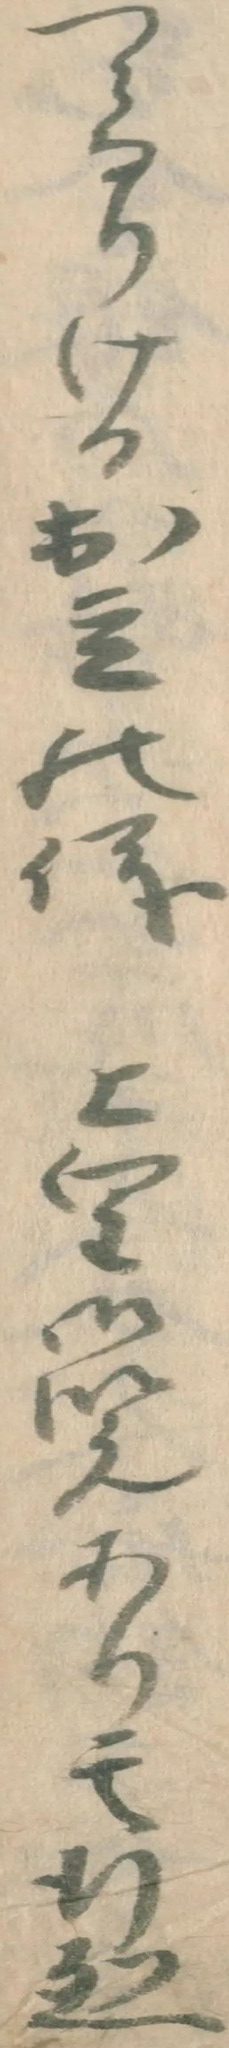つらなりける出立の儀上皇御覧あり其行烈

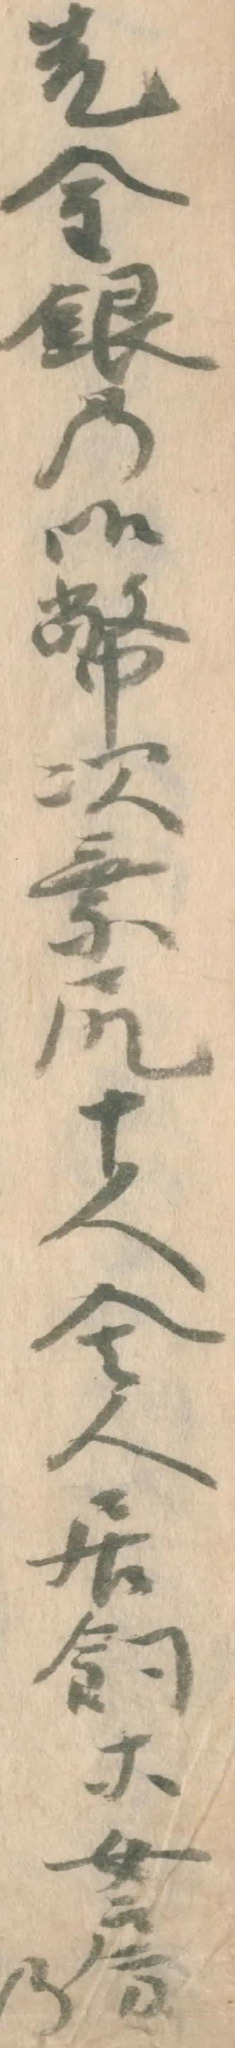先金銀の御幣次乗尻十人舎人居飼等女房の
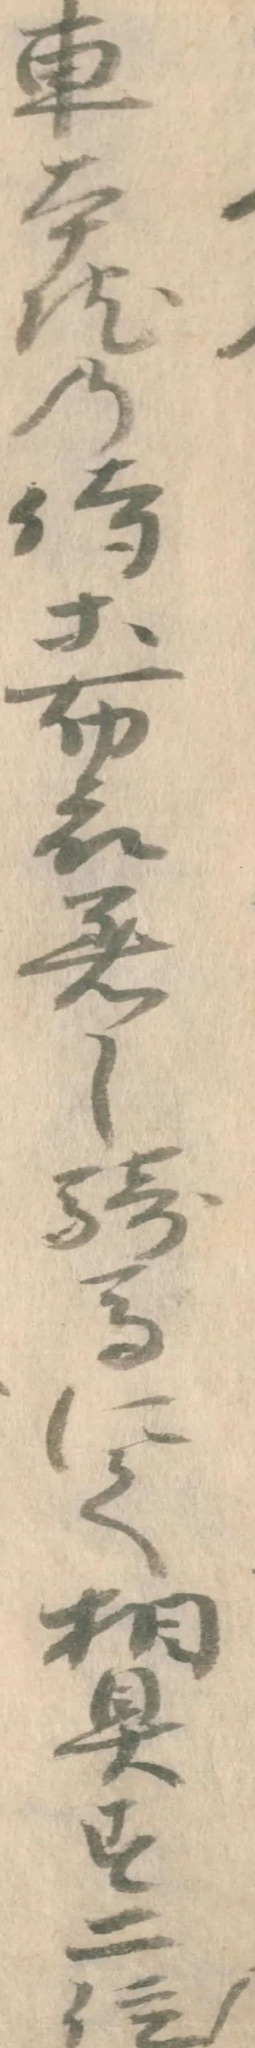東本院の侍等布衣着し騎馬にて相具す二位
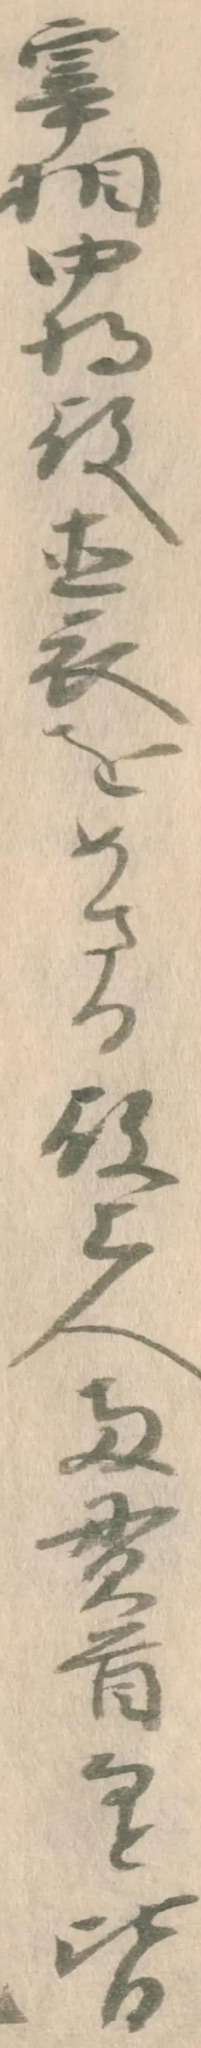宰相中将殿直衣をめさる殿上人両貫首なと皆
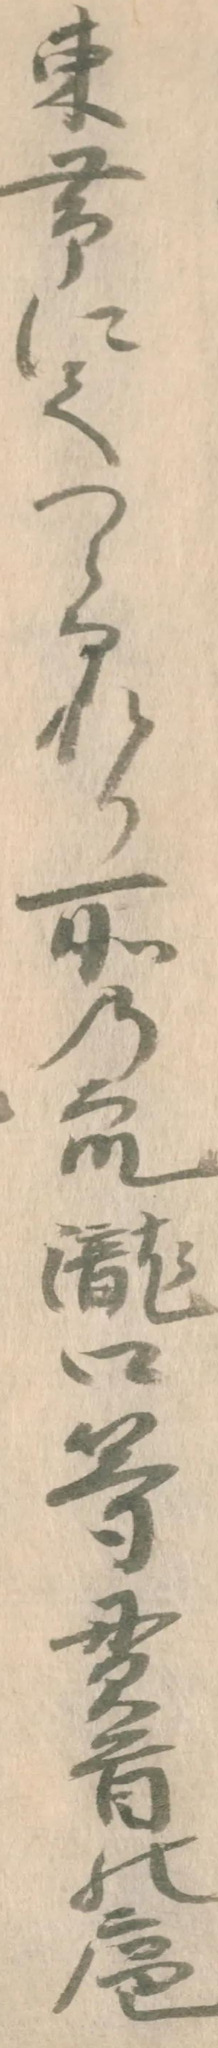束帯にてつらなれり所の衆瀧口等貫首の扈
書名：賀茂社記録. 第1冊
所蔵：国立国会図書館 National Diet Library, JAPAN
